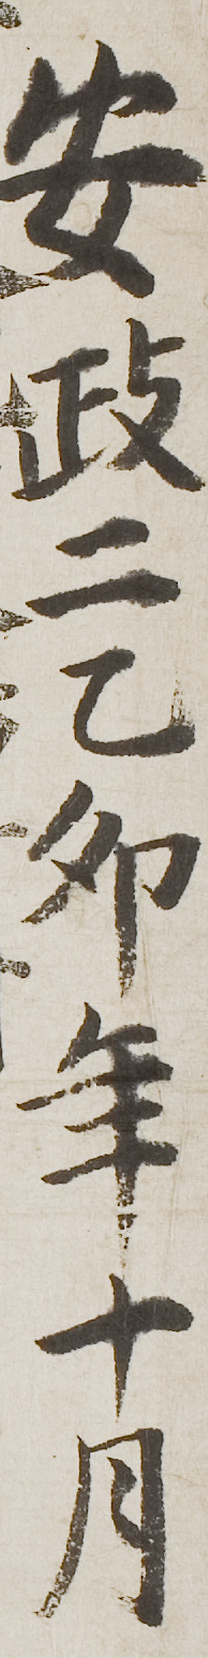安政二乙卯年十月
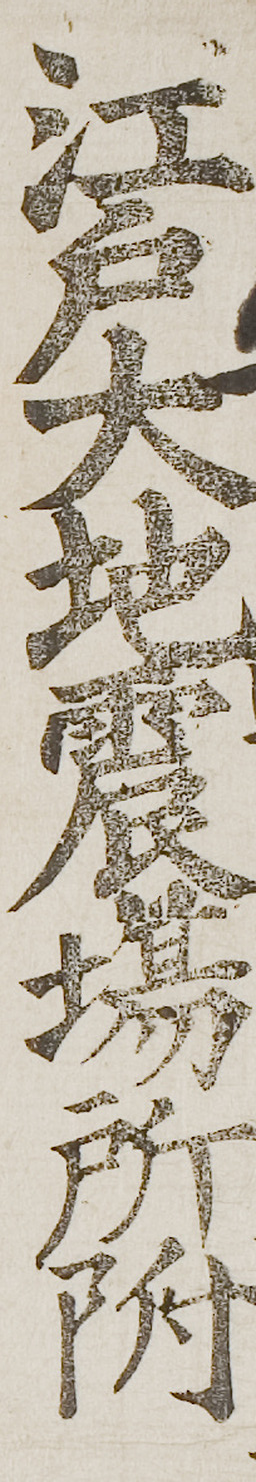江戸大地震場所附
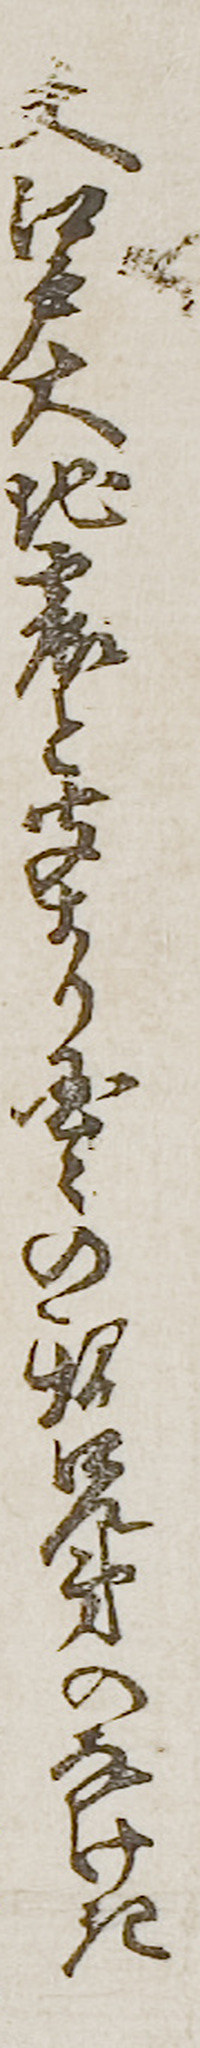夫江戸大地震と聞より国々の親兄弟のなけき
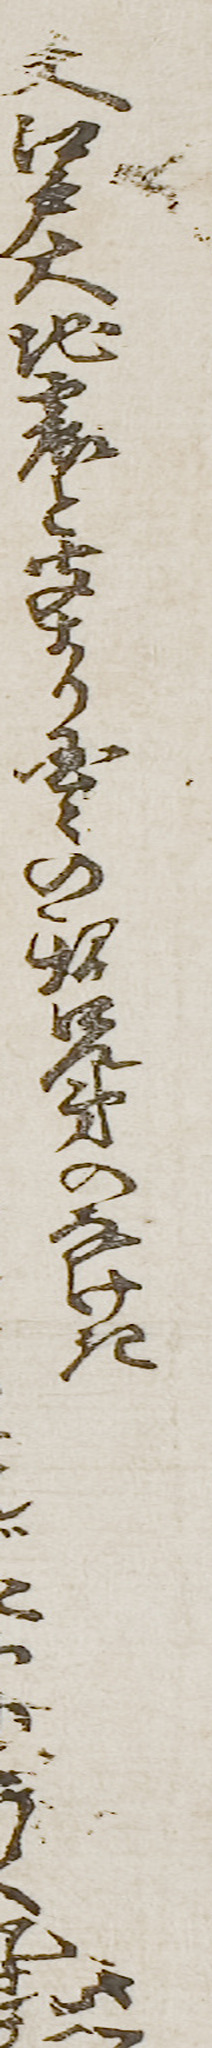夫江戸大地震と聞より国々の親兄弟のなけき
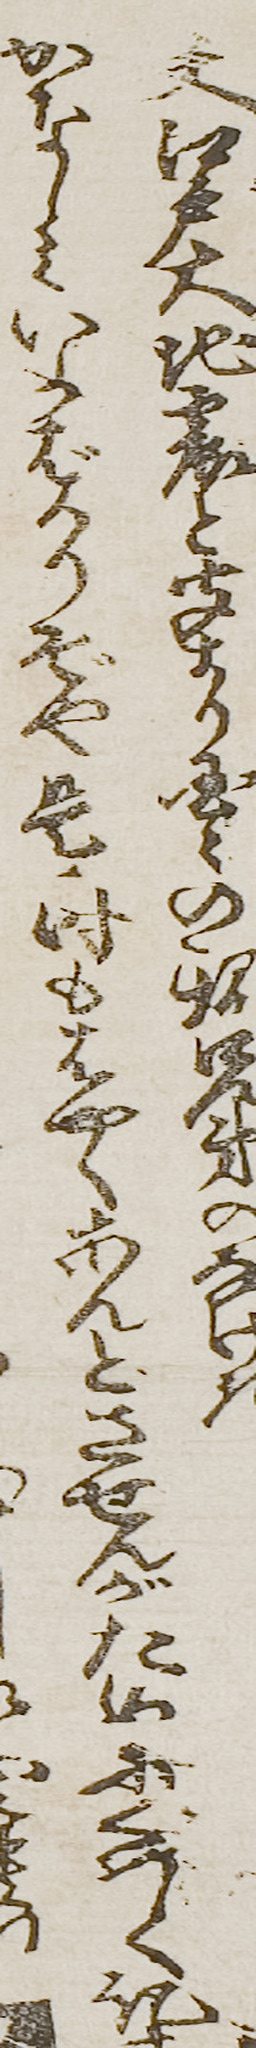かなしみいかばかりぞや是一時もはやくあんとさせんがためにくはしく記
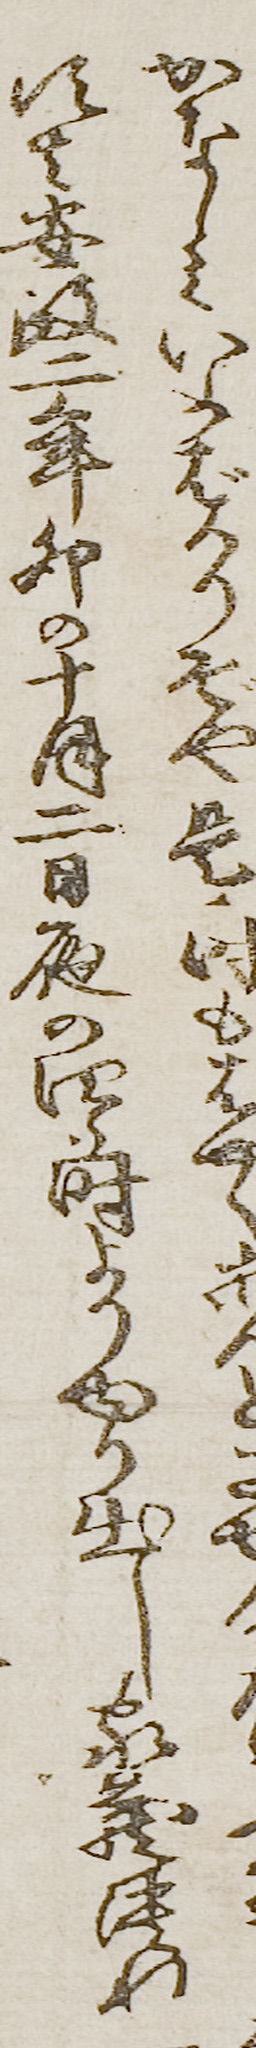すは安政二年卯の十月二日夜四つ時よりゆり出し家蔵潰れ
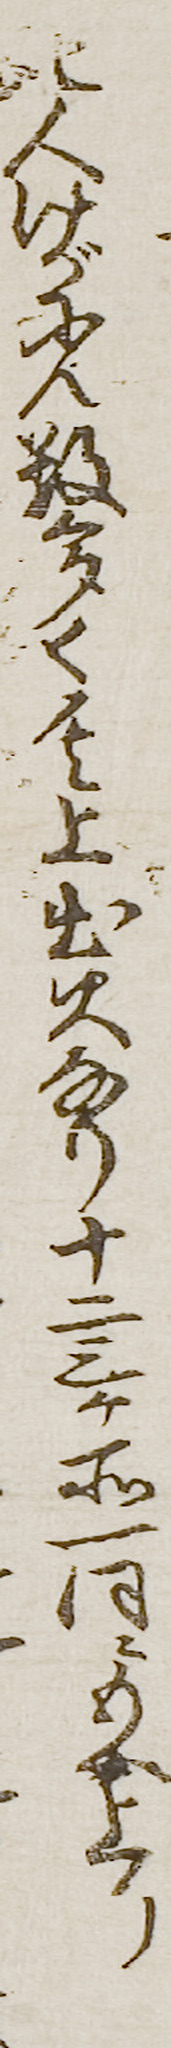死人けがにん数多く其上出火なり十二三ヶ所一同にもへ上り
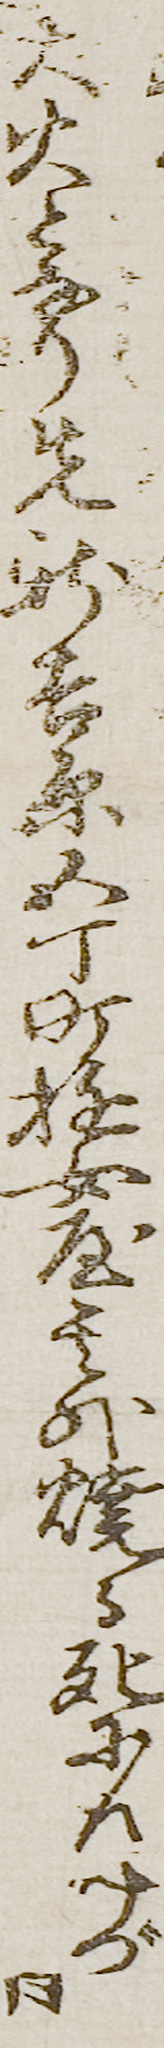大火となり先新吉原五丁町遊女屋其外焼る死にんけが
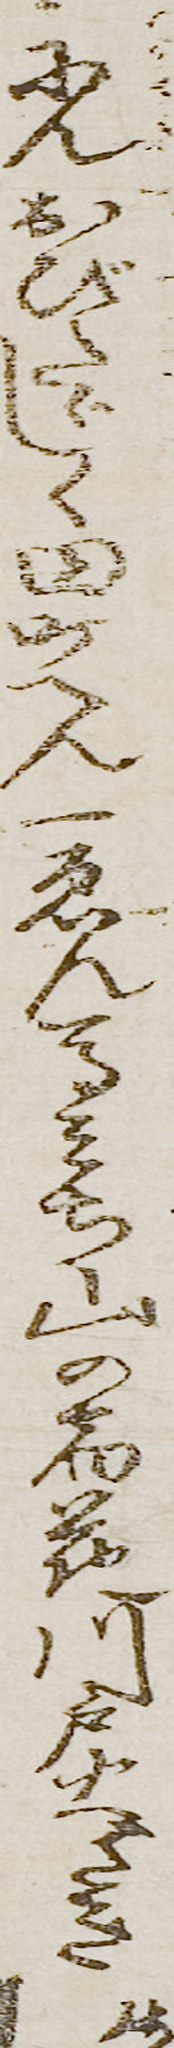にんおびたゞしく田町へん一ゑん馬みち山の宿花川戸火
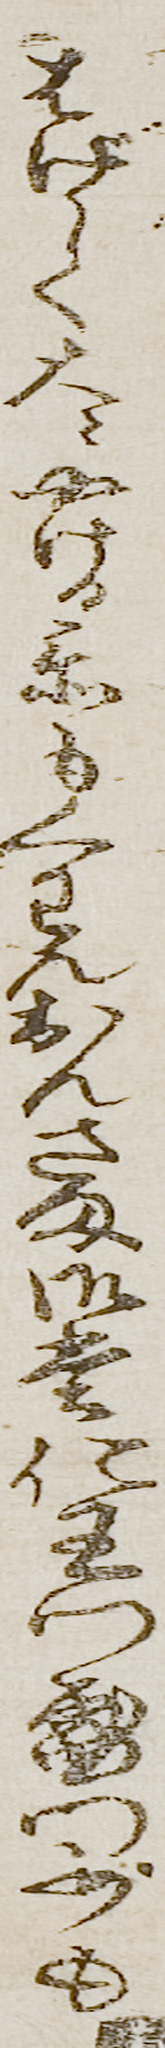はげしく大にやける忝もくわんおんさま御堂仁王門雷門少も
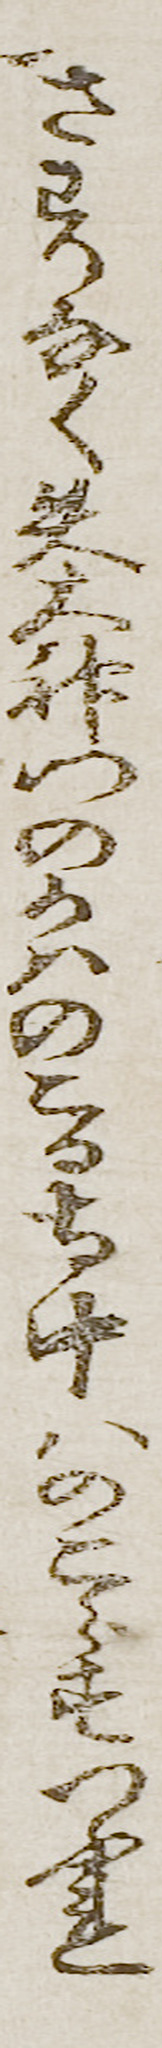さわりなく矢大神門のかはのこる寺中はのこらすつふれ
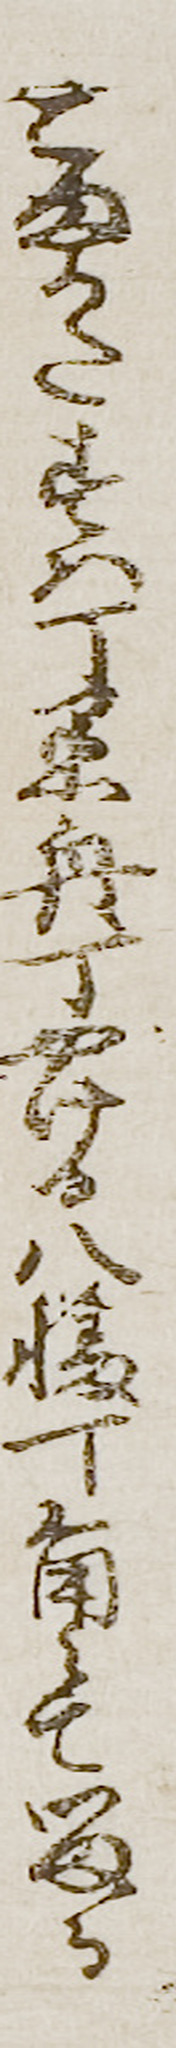こまかたすは丁黒舟丁やける八幡丁角にて留る
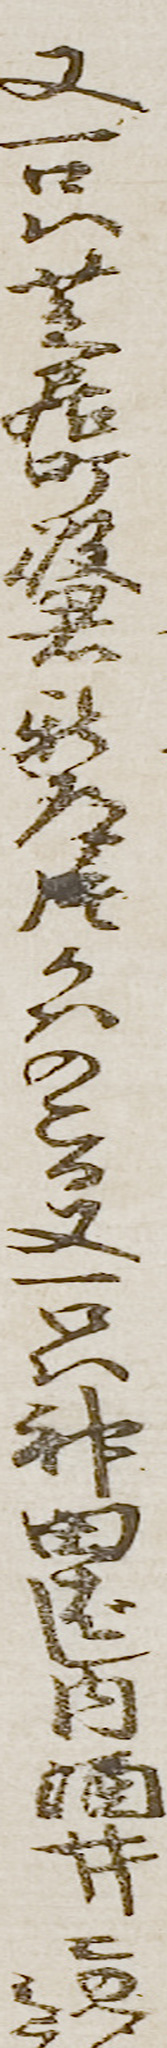又一口は芝居町役者新道片かはのこる又一口は神田ばし内酒井
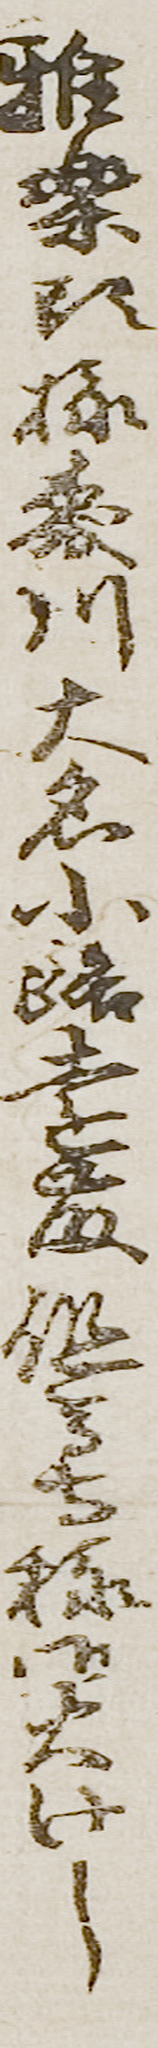雅楽頭様森川大名小路遠藤但馬守様御火けし
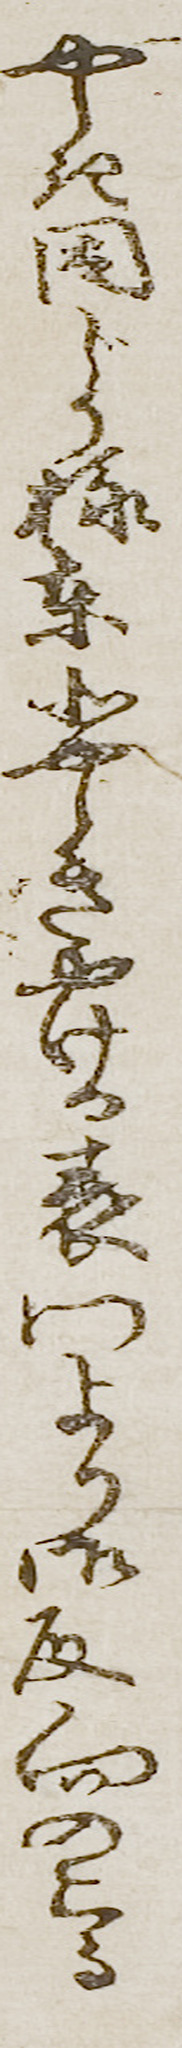やしき因じう様東北やしきやける表門より御殿向のこる
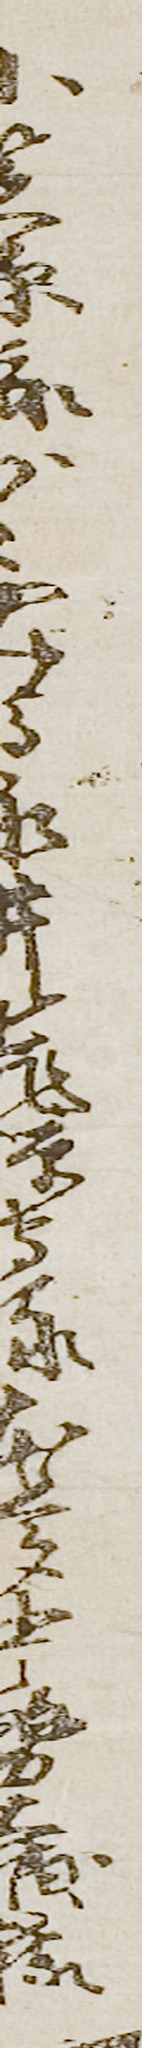小笠原様少々やける永井飛騨守様本多中務大輔様
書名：江戸大地震場所附
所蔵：東京大学総合図書館 General Library in the University of Tokyo, JAPAN
